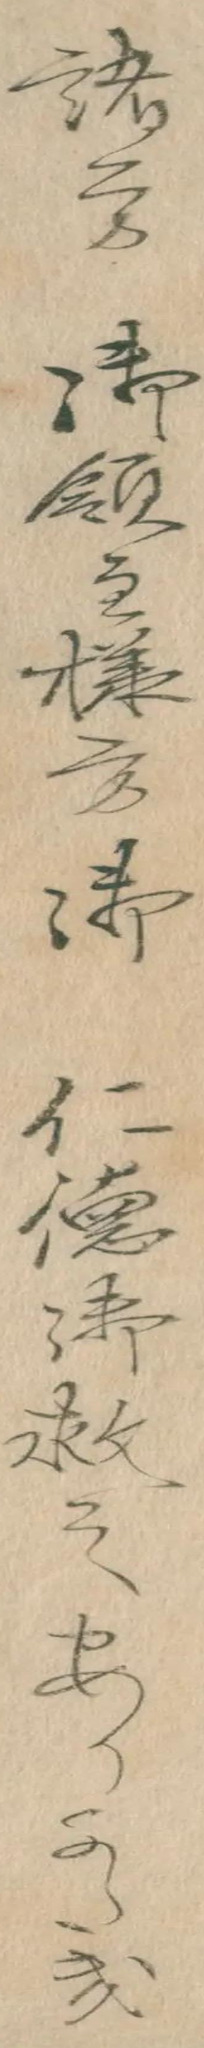諸方御領主様方御仁徳御救てありかたき
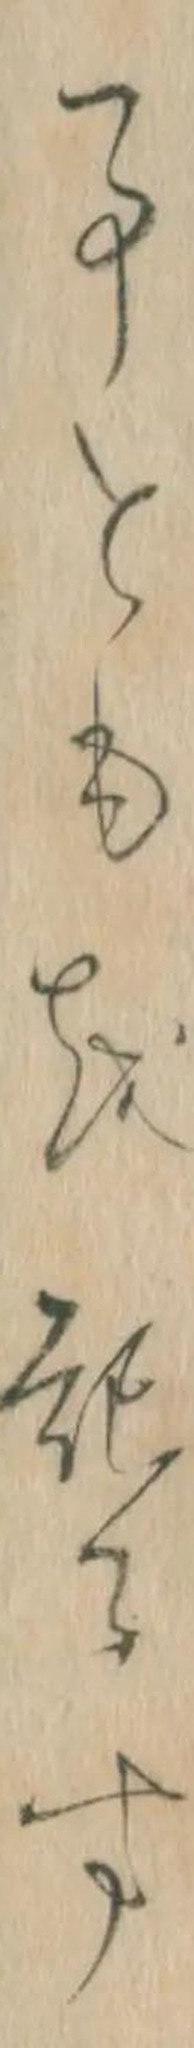事ともを記事す

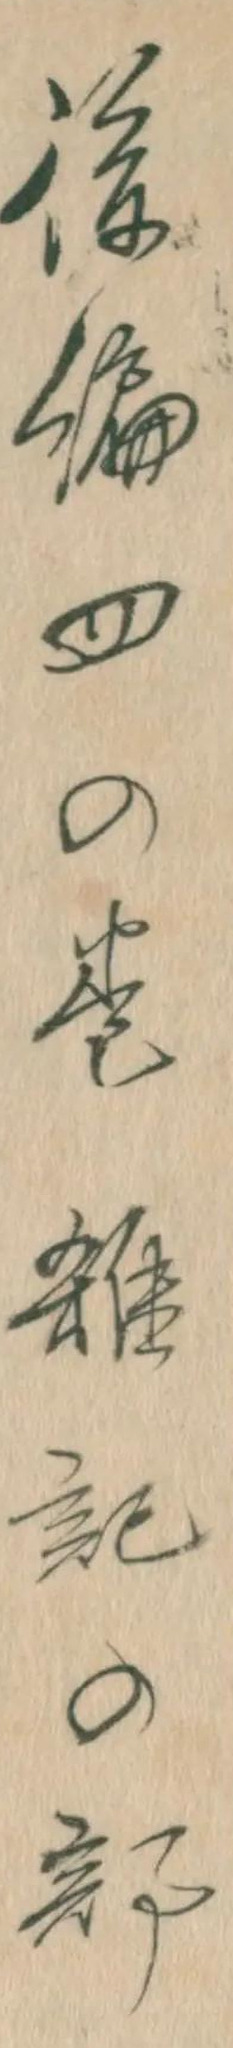後編四の巻雑記の部
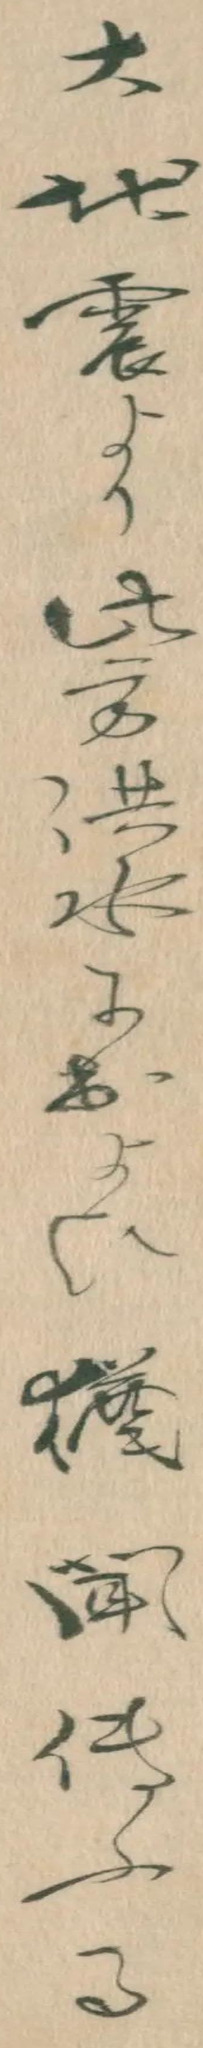大地震より此方洪水におよひ猶聞伝ふる
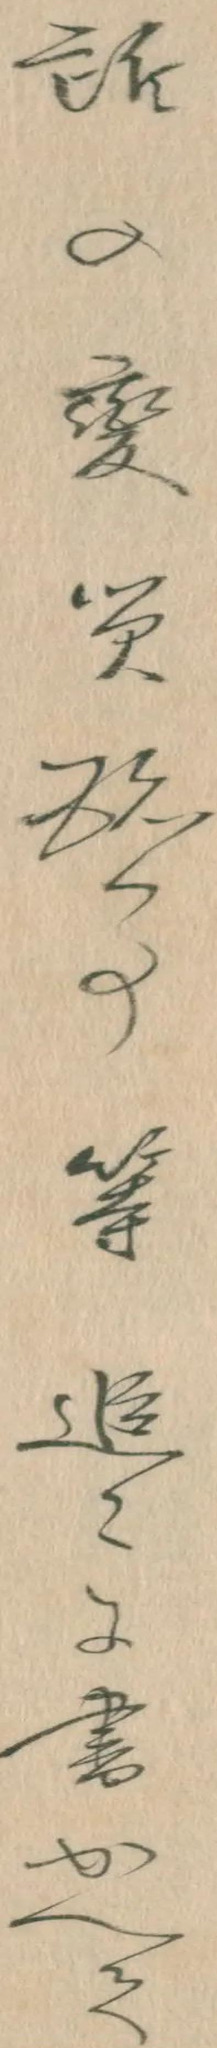所の変災跡事等追々に書かへて
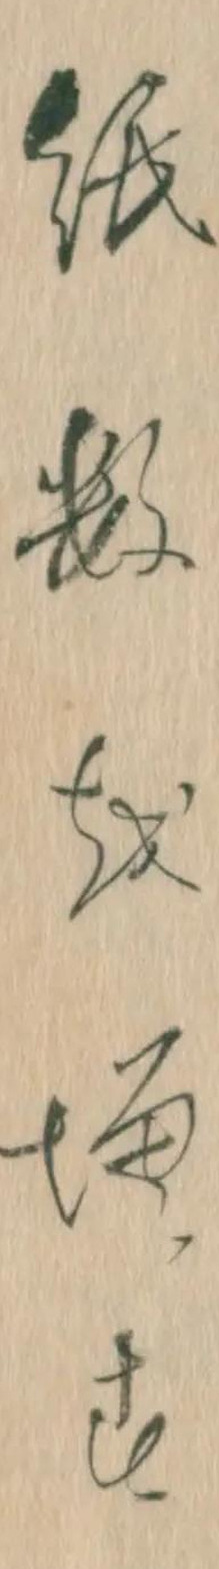紙数を増す
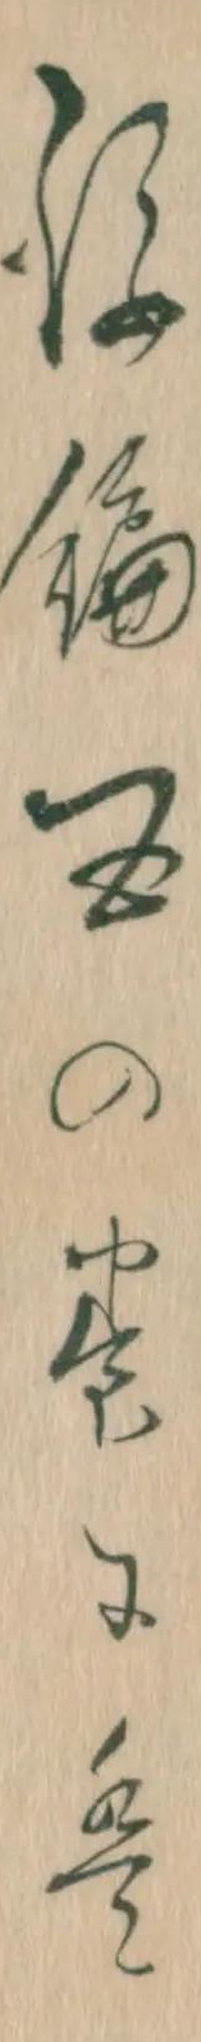後編五の巻には
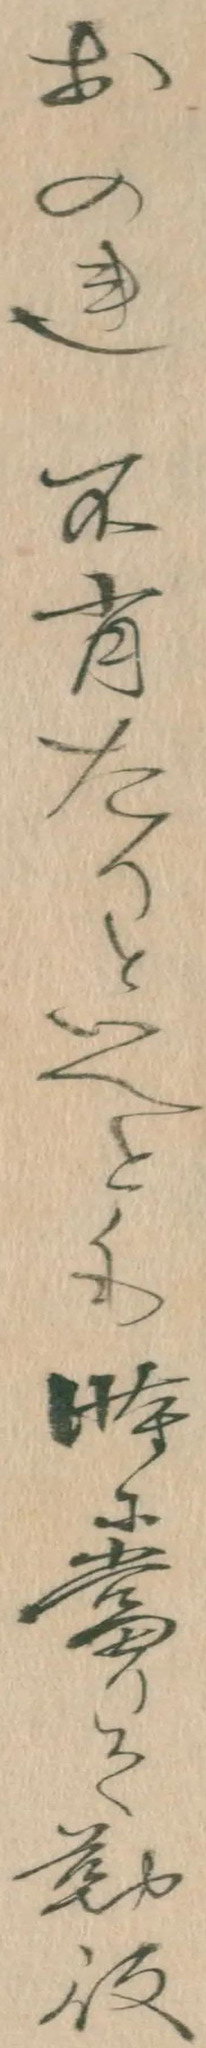おのれ不肖たりといへとも時に当りて勤役
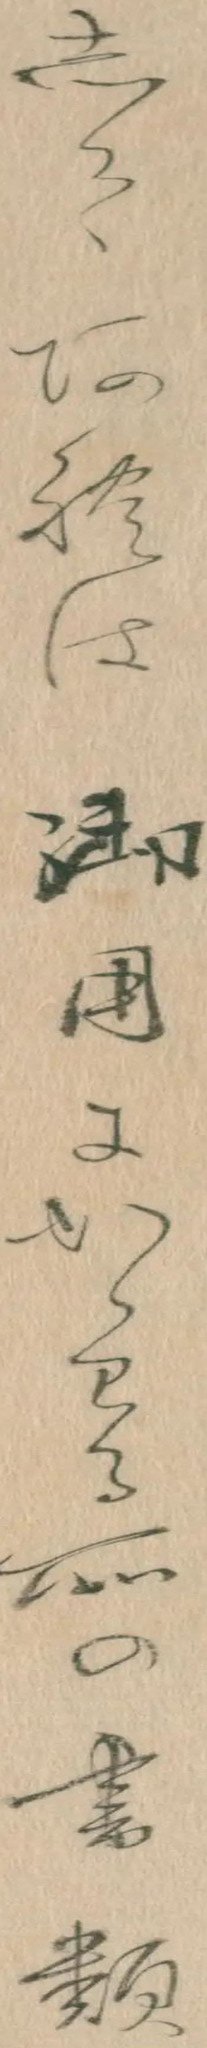してあれは御用にかゝわる所の書類
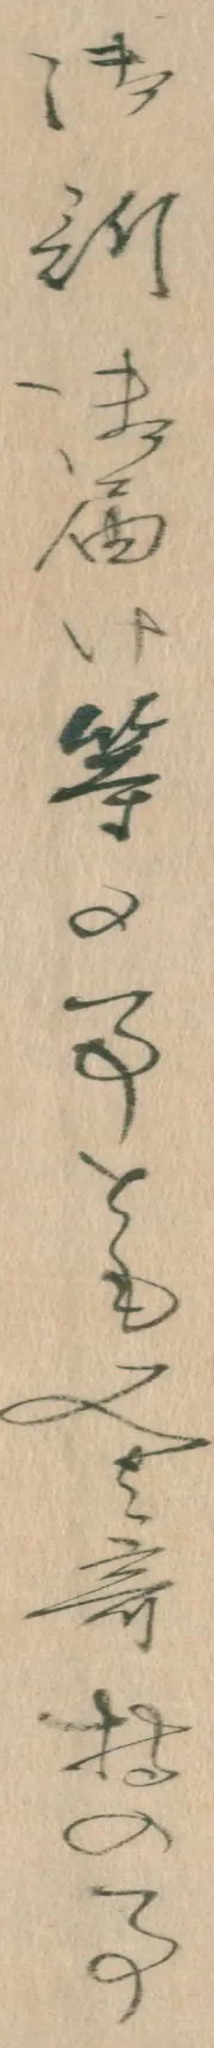御訴御届け等の事とも又は寄持の事
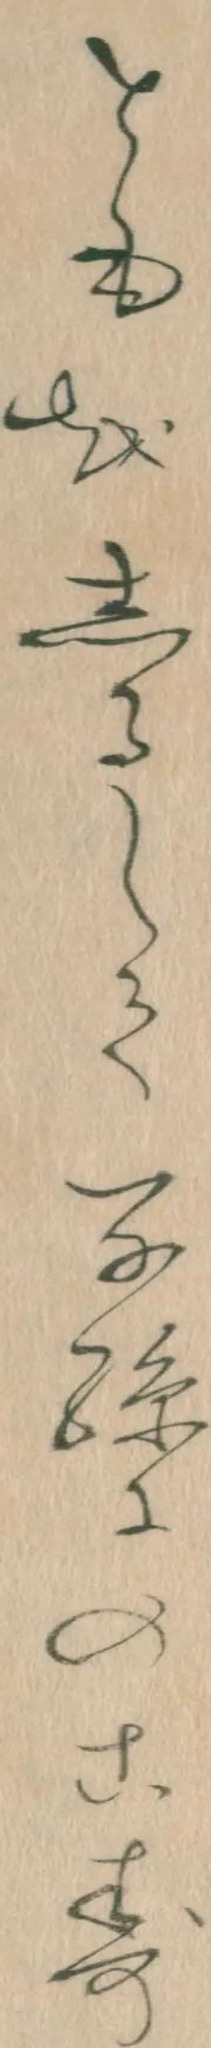ともをしるして子孫にのこす
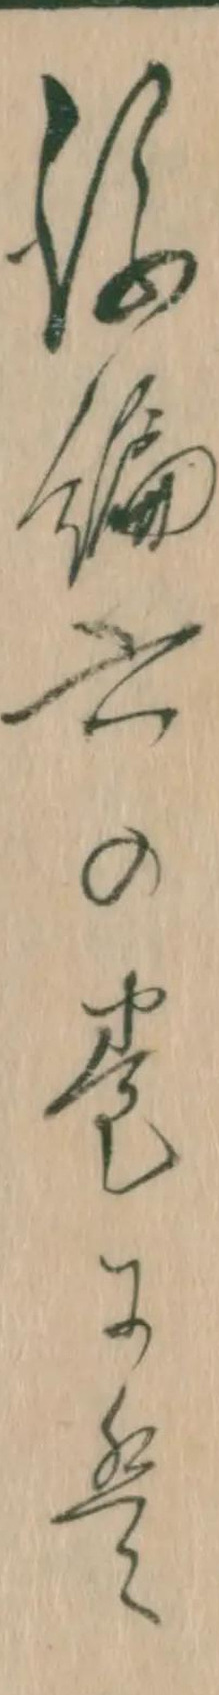後編六の巻には
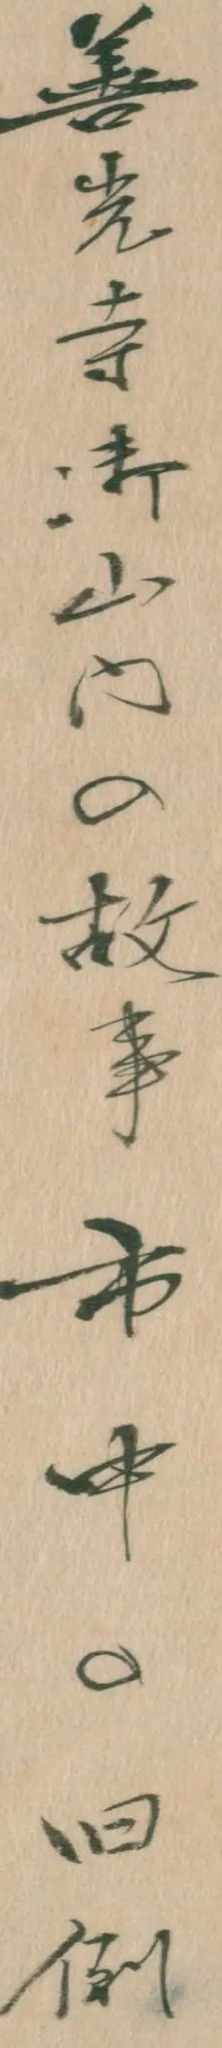善光寺御山内の故事市中の旧例
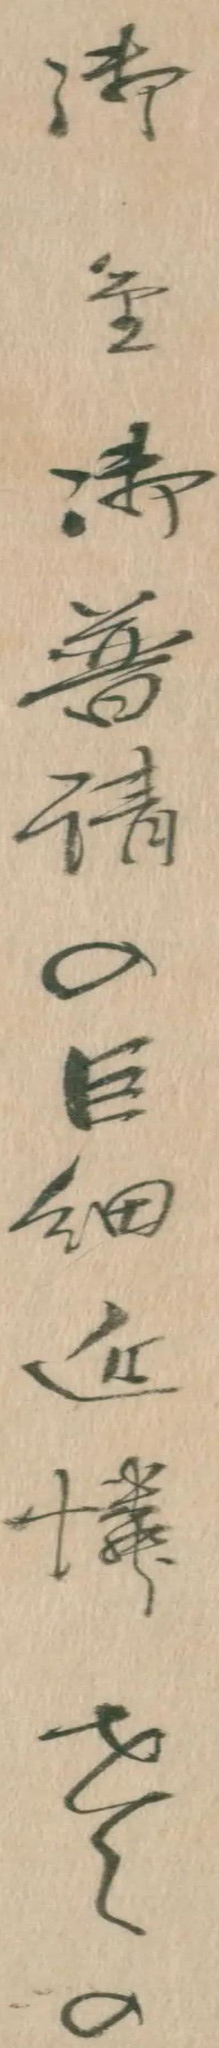御堂御普請の巨細近隣世々の
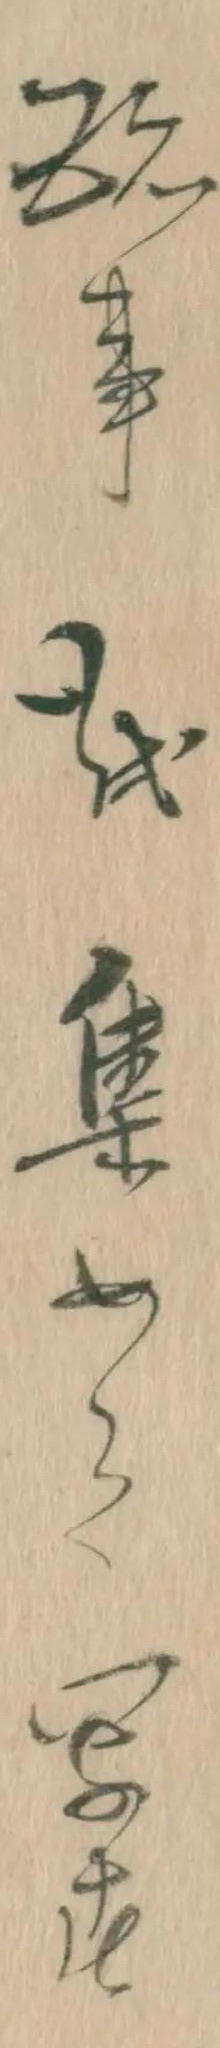跡事を集めて写す
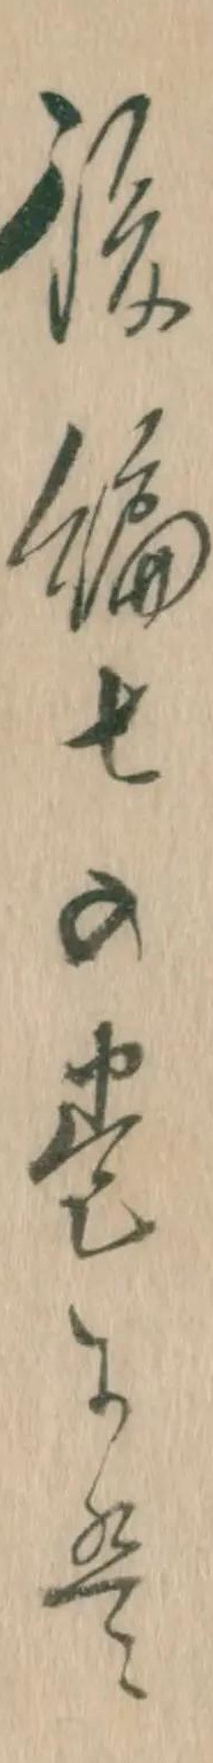後編七の巻には
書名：俗語之種. [7]
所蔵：国立国会図書館 National Diet Library, JAPAN
